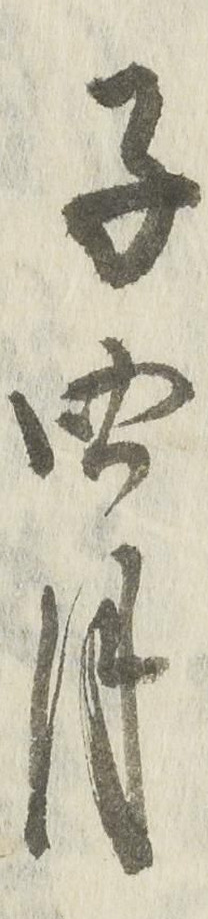子四月
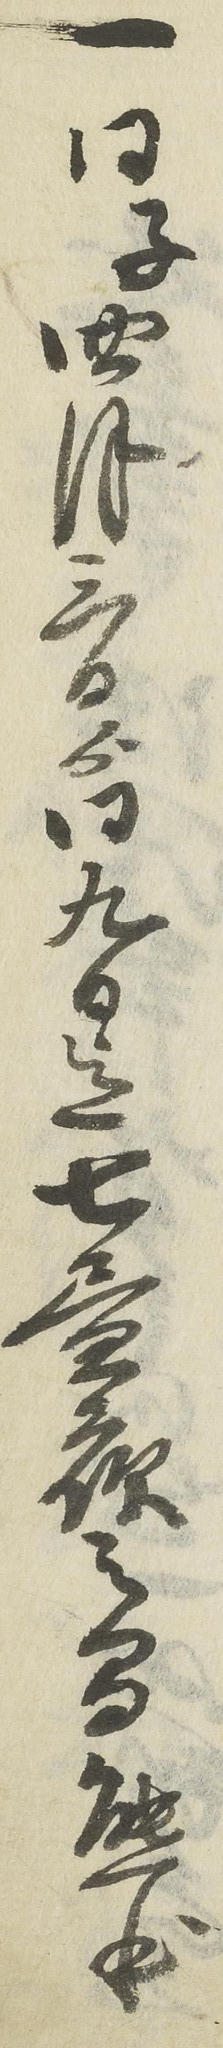一同子四月三日ゟ同九日迄七昼夜之間熊本

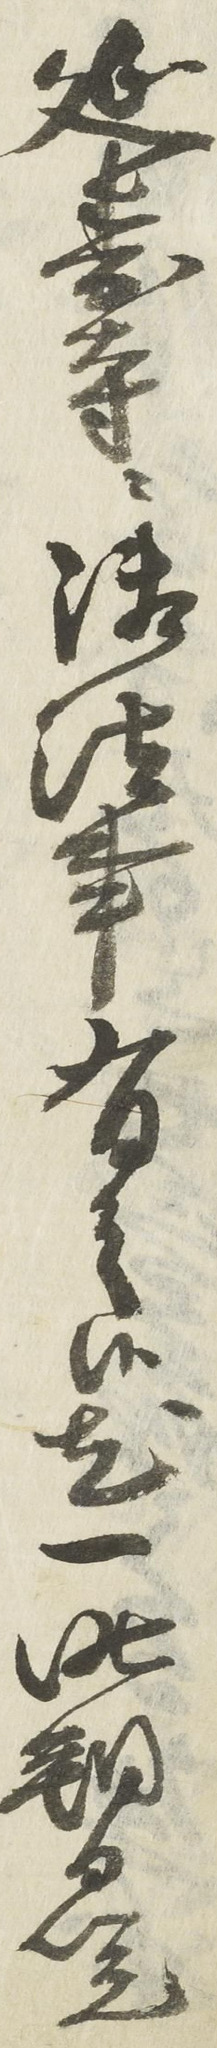延壽寺ニ御法事有之候尤一昨朔日晩
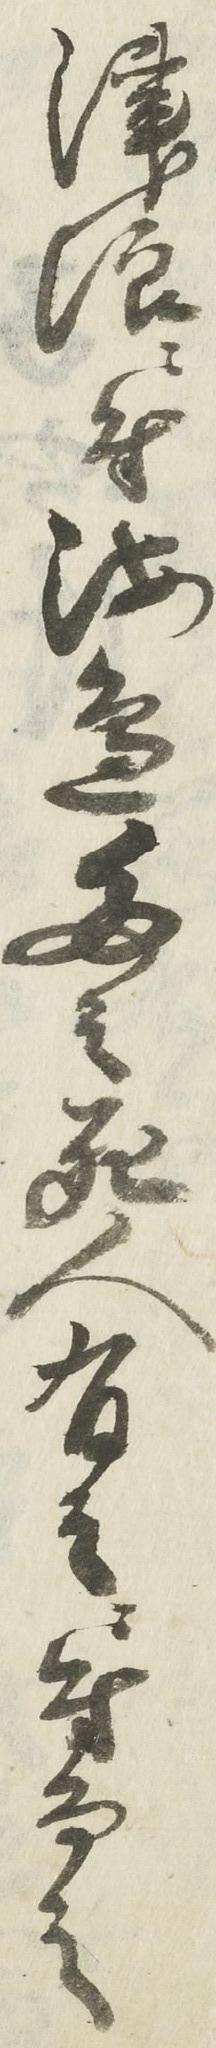津浪ニ付海辺多之死人有之ニ付而之
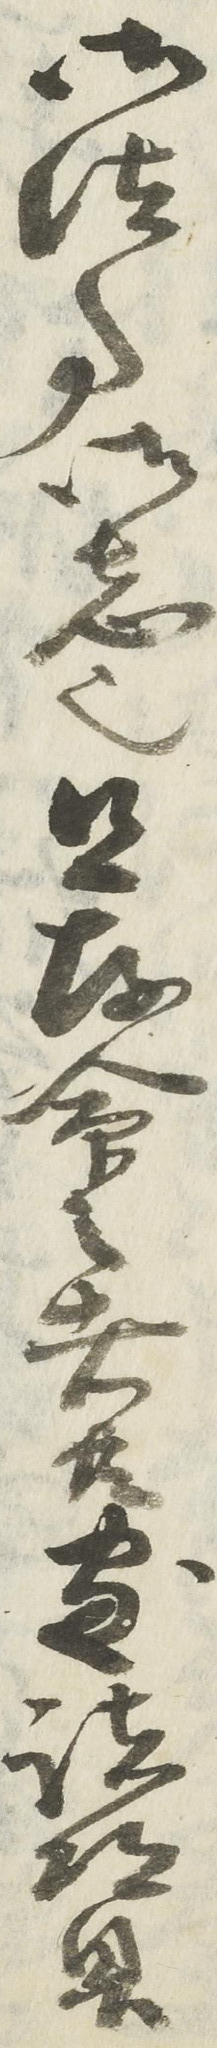御法事御志也且存命之者共家諸道具
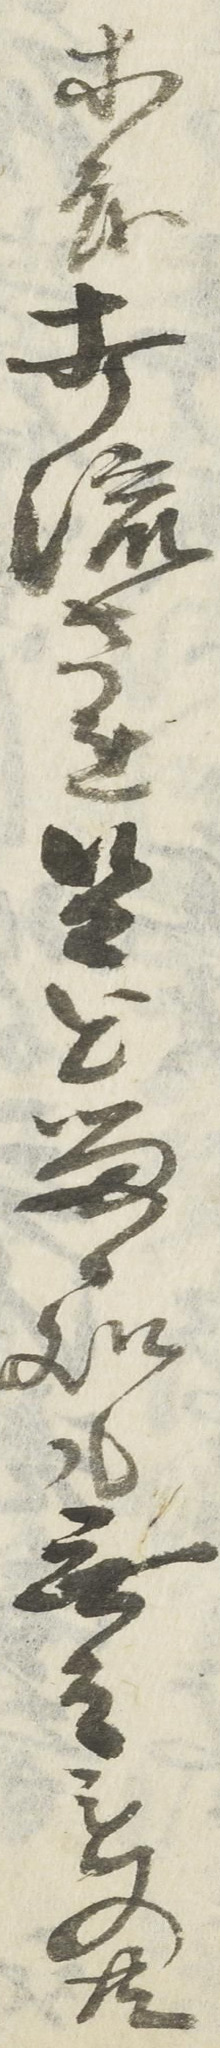等も打流され是を留る処も無之もの共
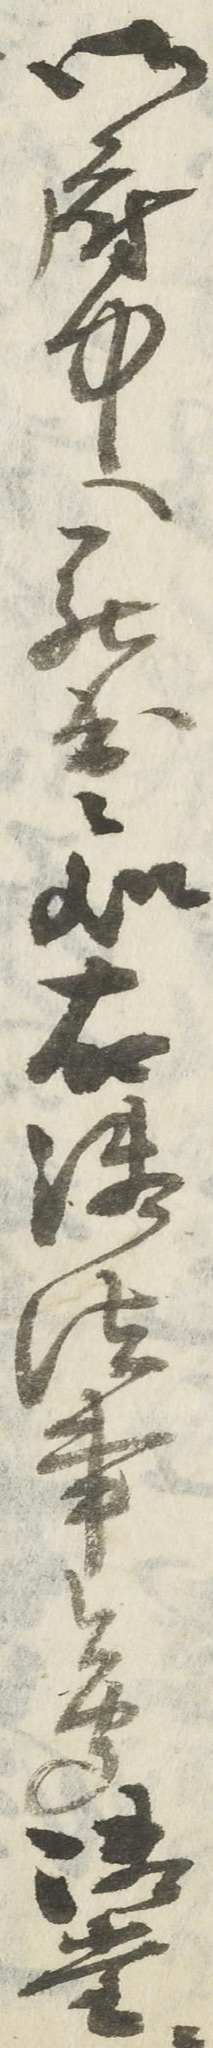御府中へ罷出候処右御法事と聞御堂ニ
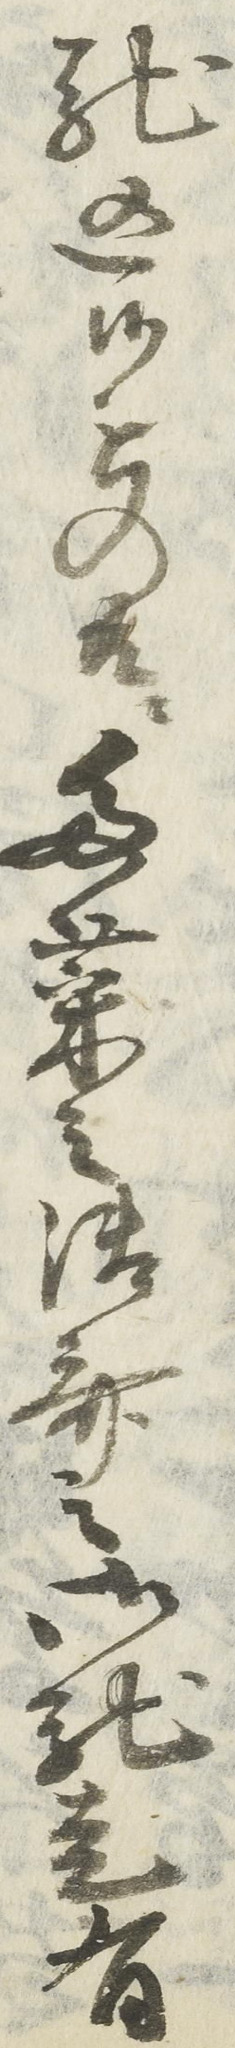罷込候もの共ニ多菜の御斎之御馳走有
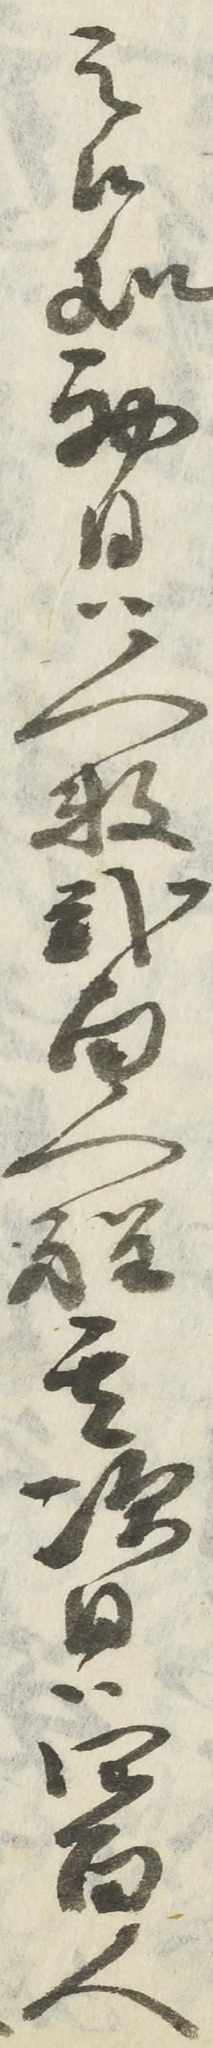之候処初日は人数弐百人程其次日は四百人
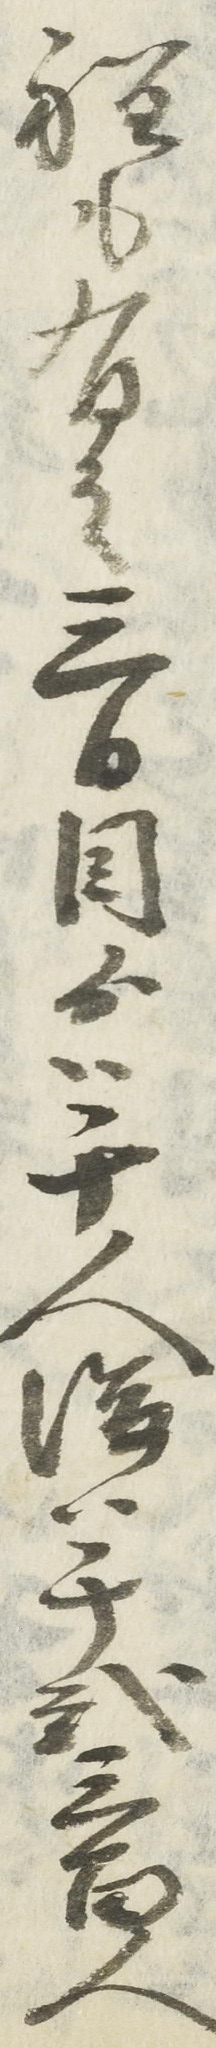程も有之三日目ゟは千人後は千弐三百人
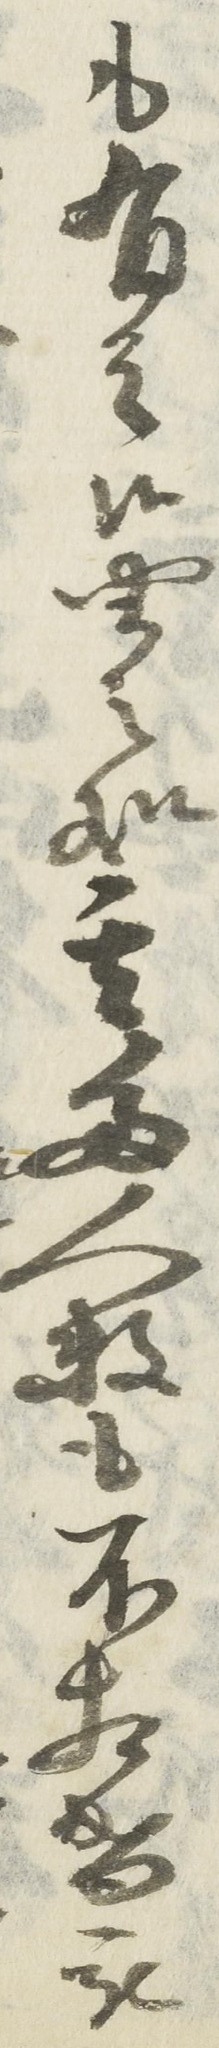も有之候由之処其多人数も不相替被
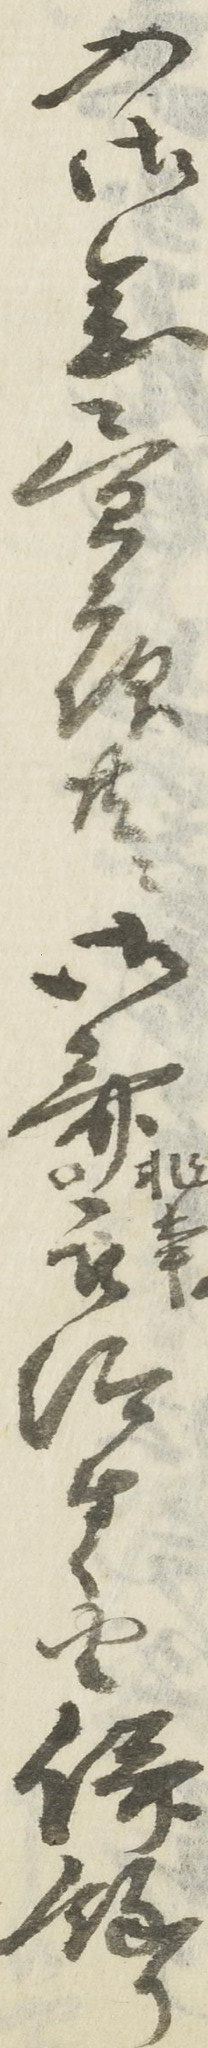為御念昼夜共ニ御斎非事被仰付候由併餘り
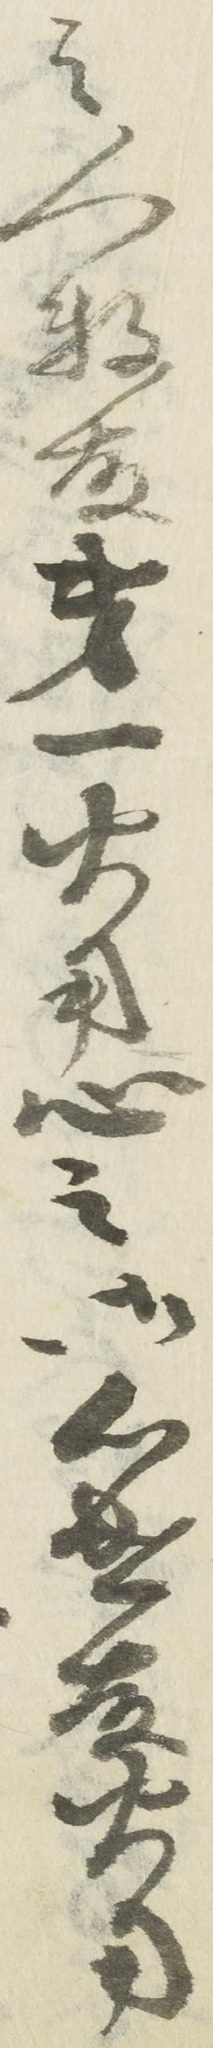之人数故第一火用心之御心懸故火用
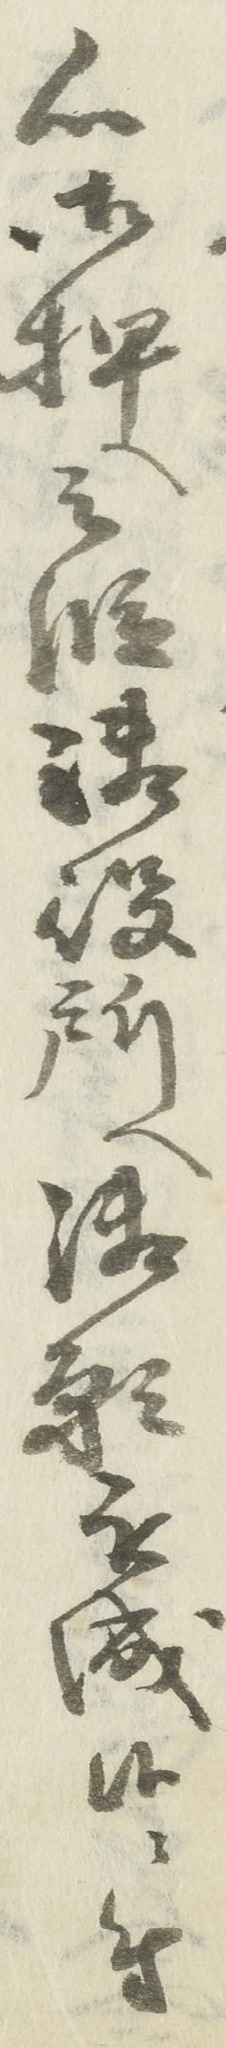心御押へ之段御役所へ御願被成候ニ付
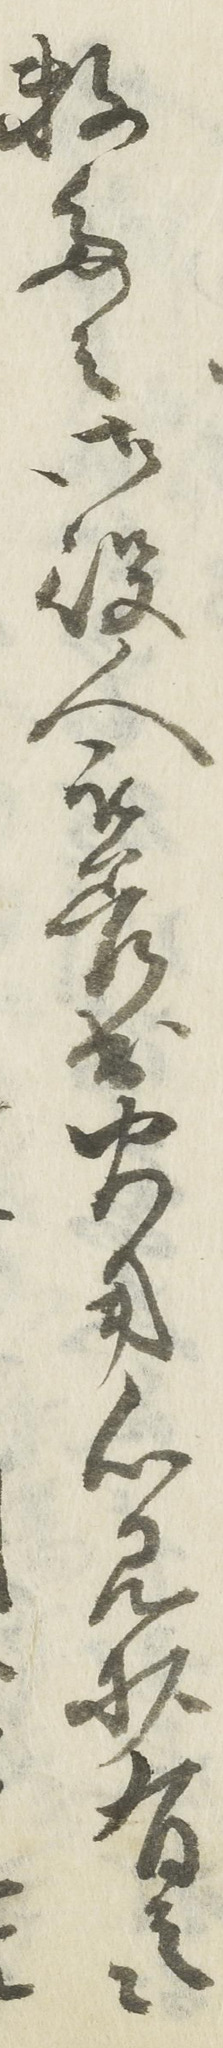数多之御役人被差出火用心見扑有之ニ
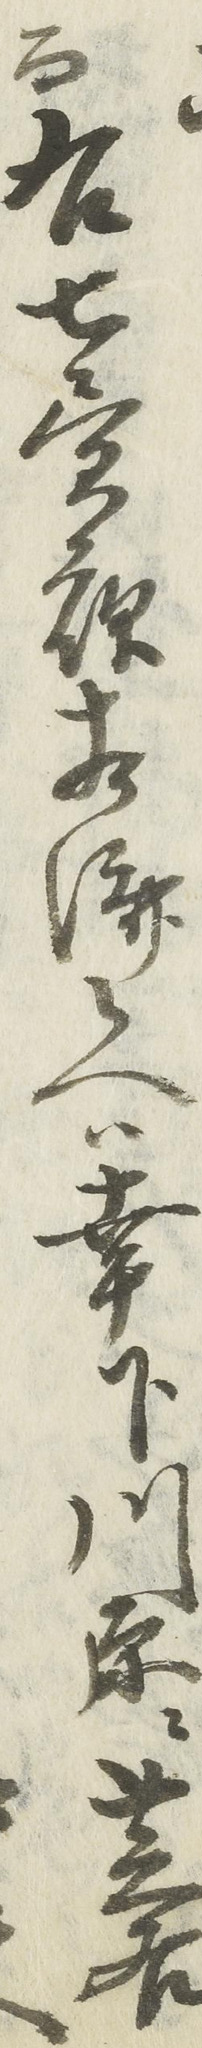而右七昼夜相済候へは幸下川原ニ芝居
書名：後見笑
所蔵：東京大学地震研究所図書室 Earthquake Research Institute Library, The University of Tokyo, JAPAN
